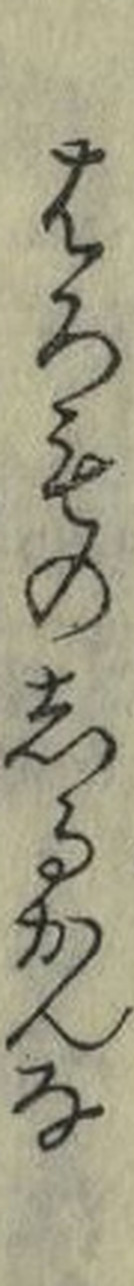はろものしるかんな
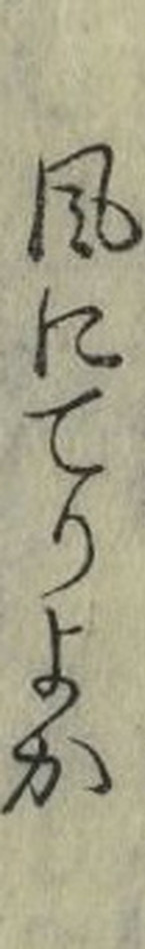風にてりよか
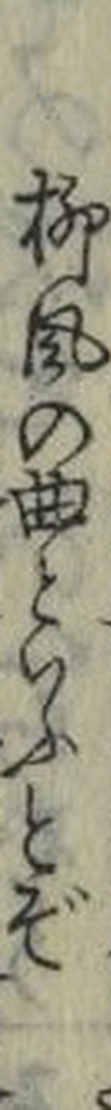柳風の曲といふとぞ
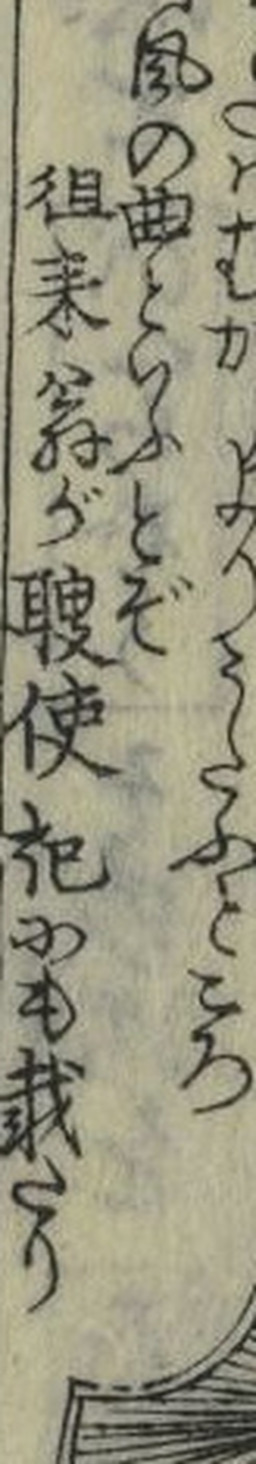徂来翁が聘使記にも載たり

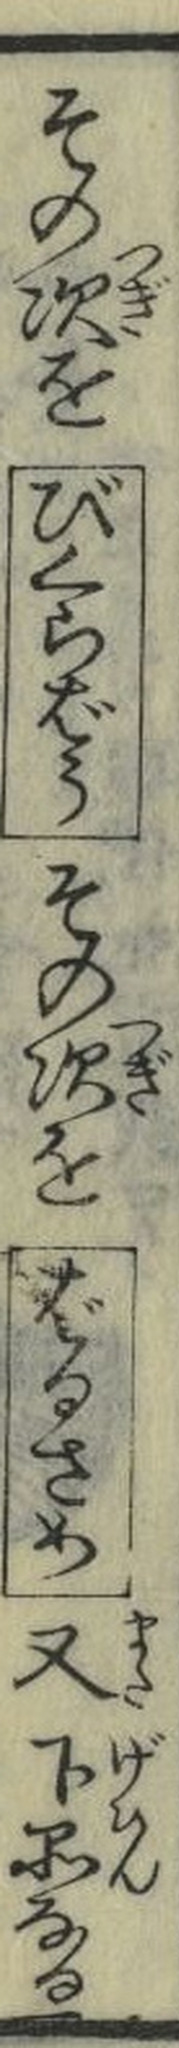その次を[びくらばう]その次を[ばるさめ]又下品なる
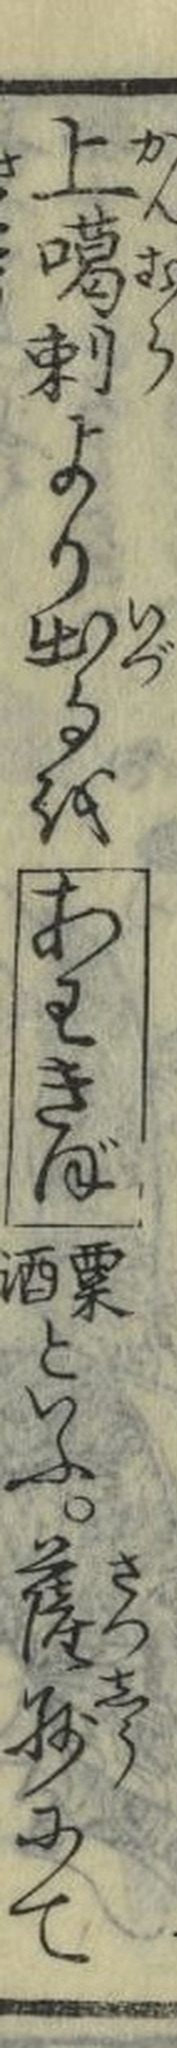上噶刺より出るを[あわきぼ]粟酒といふ。薩州にて
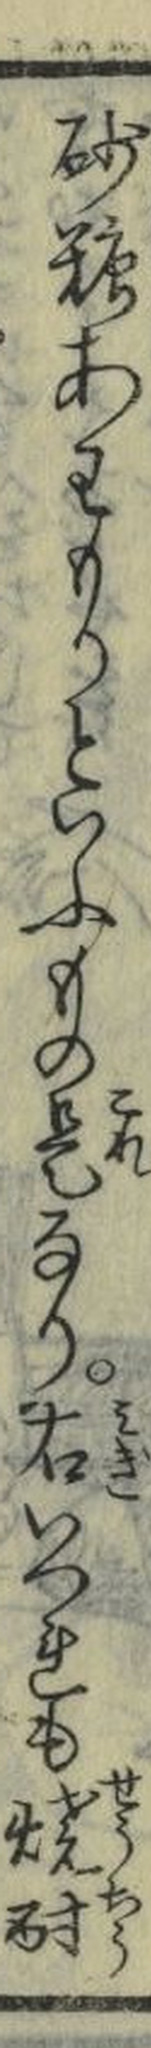砂糖あわもりといふもの是なり。右いつれも焼酎
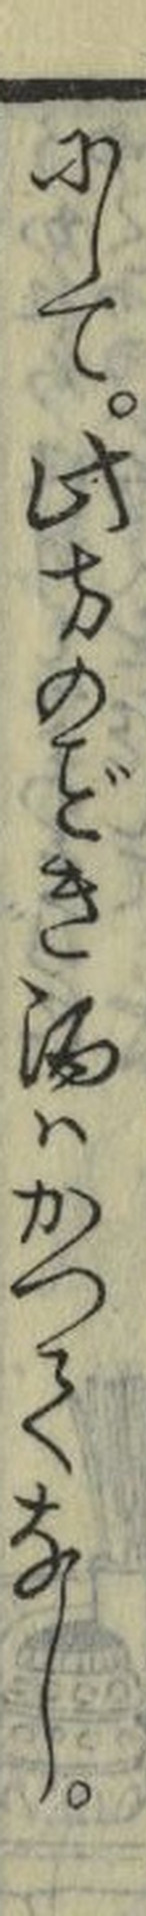にして。此方のごとき酒ハかつてなし。
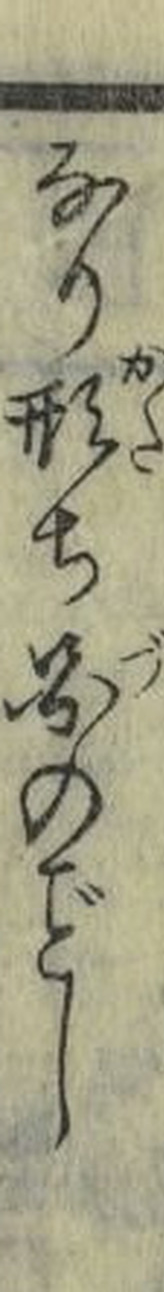なり形ち圖のごとし
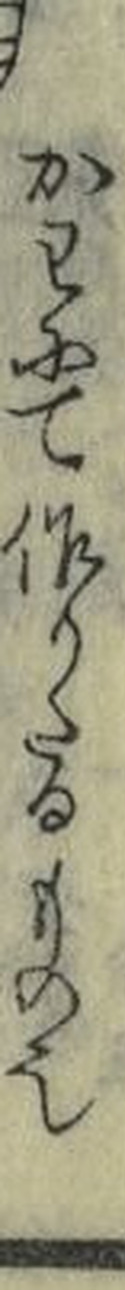かわにて作りたるもの也
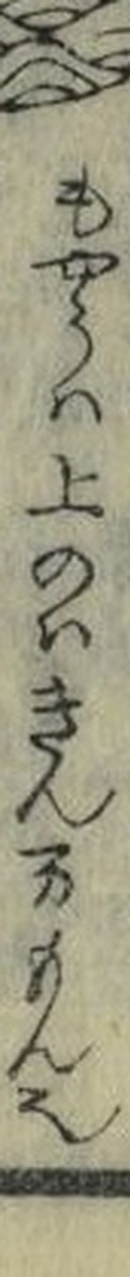もやうハ上のハきん万もん也
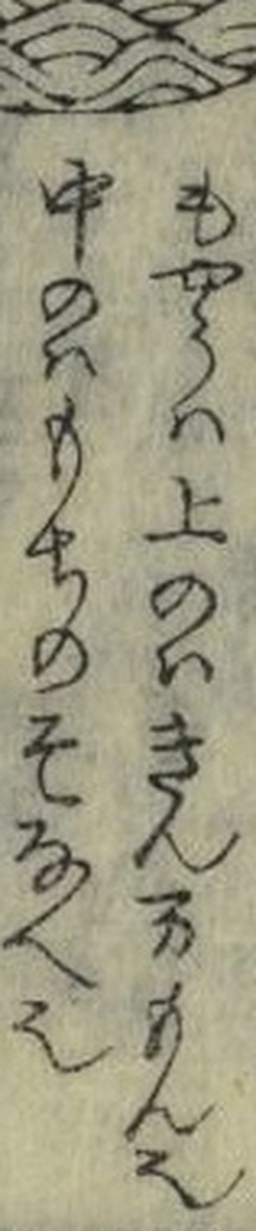中のハもちのそなへ也
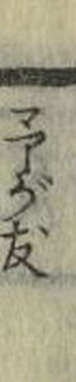予が友
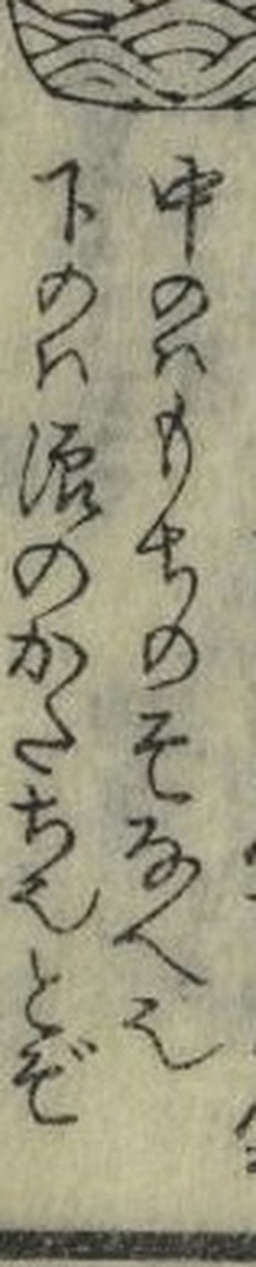下のハ浪のかたち也とぞ
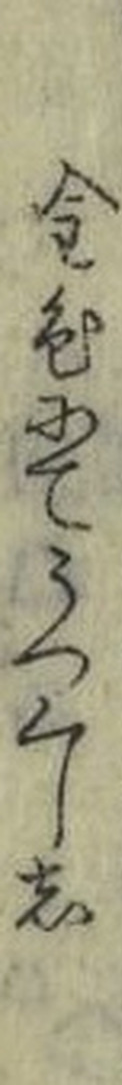金色にてうつくしし

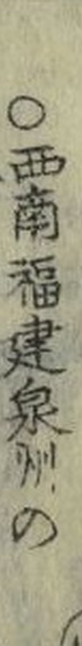〇西南福建泉州
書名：琉球奇譚
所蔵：University of the Ryukyus Library
